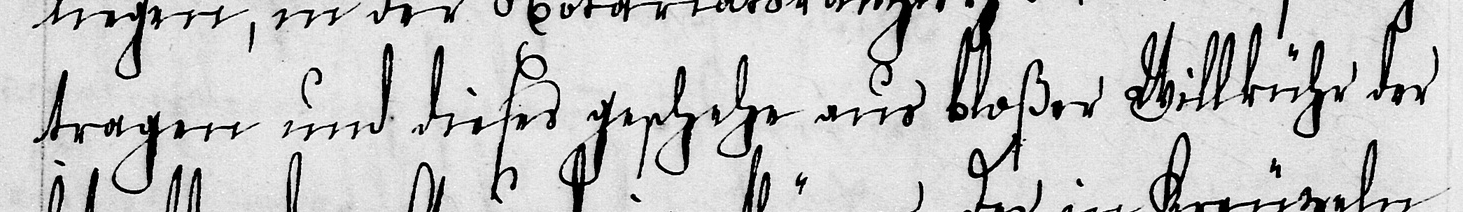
tragen und dieses geschehe aus bloßer Willkühr der
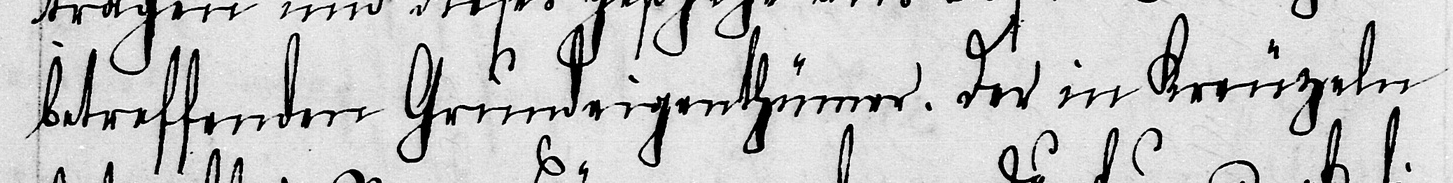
betreffenden Grundeigenthümer. Der in Kreuzeln
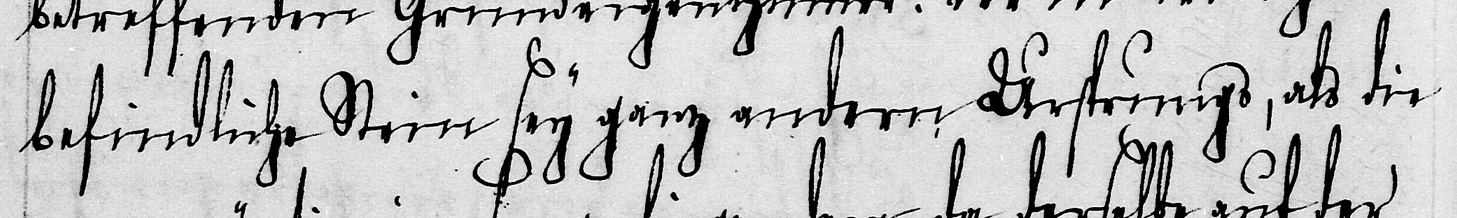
befindliche Stein sey ganz andern Ursprungs, als die
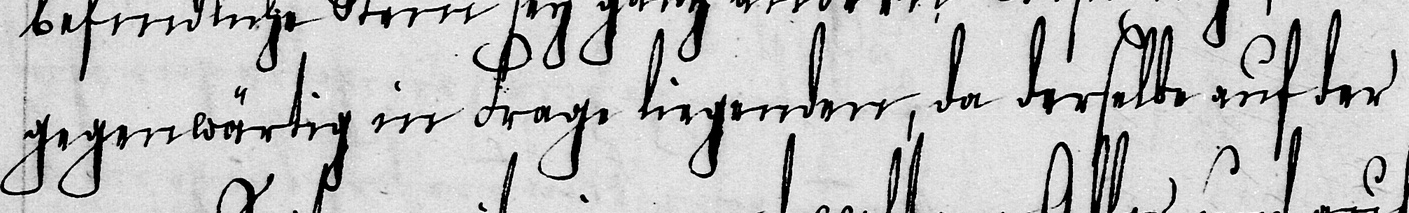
gegenwärtig in Frage liegenden, da derselbe auf der
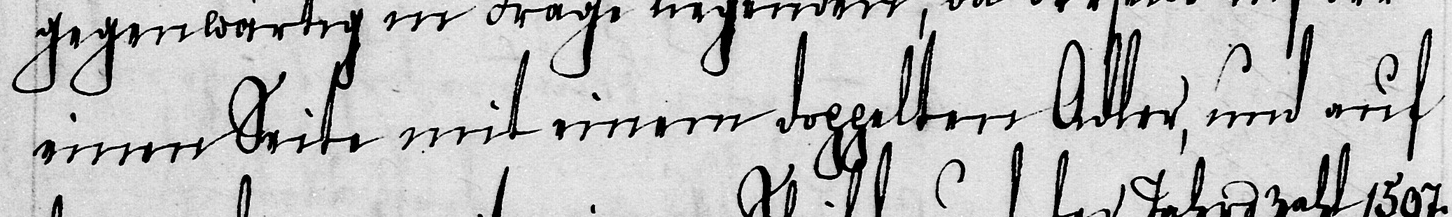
einen Seite mit einem doppelten Adler, und auf
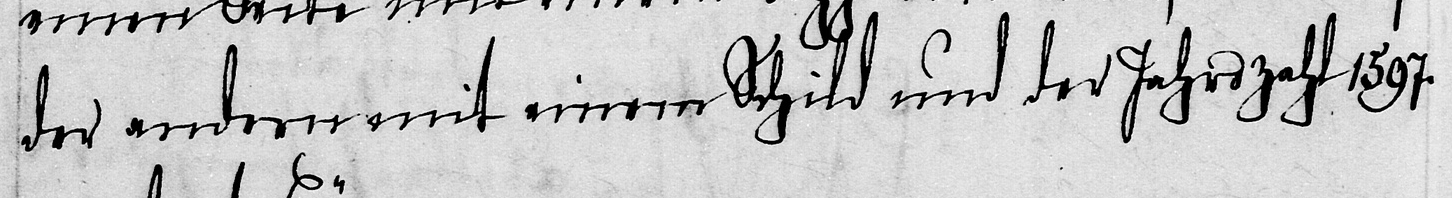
der andern mit einem Schild und der Jahreszahl 1597.
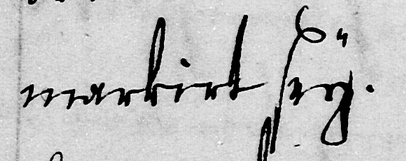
markirt sey.
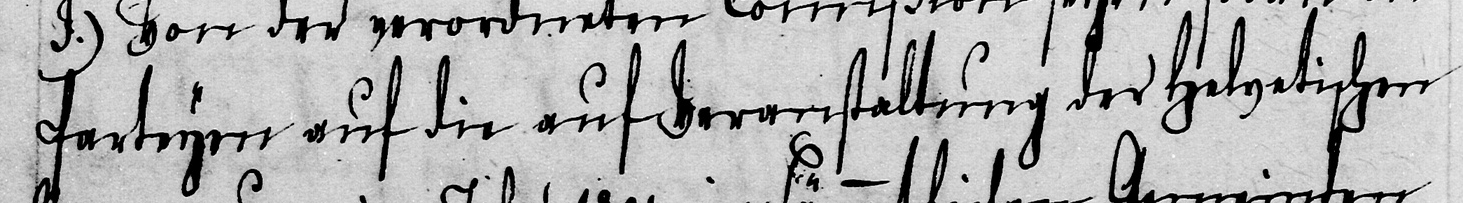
Parteyen auf die auf Veranstaltung der helvetischen
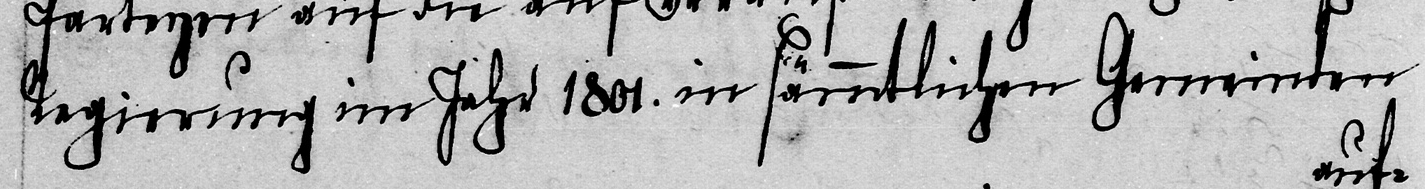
Regierung im Jahr 1801. in sämmtlichen Gemeinden
